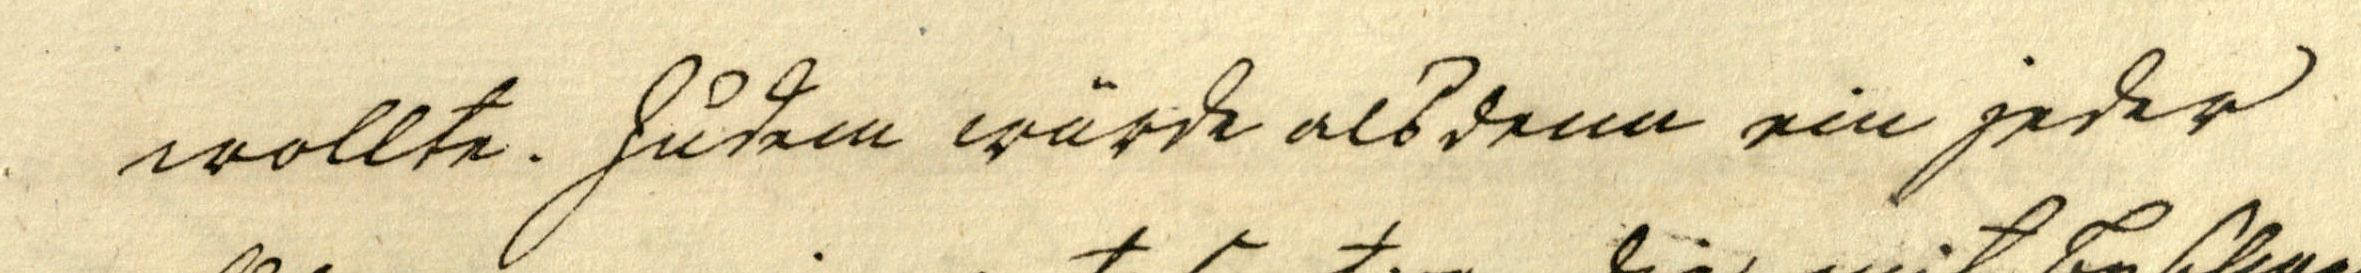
wollte. Zudem würde alsdenn ein jeder
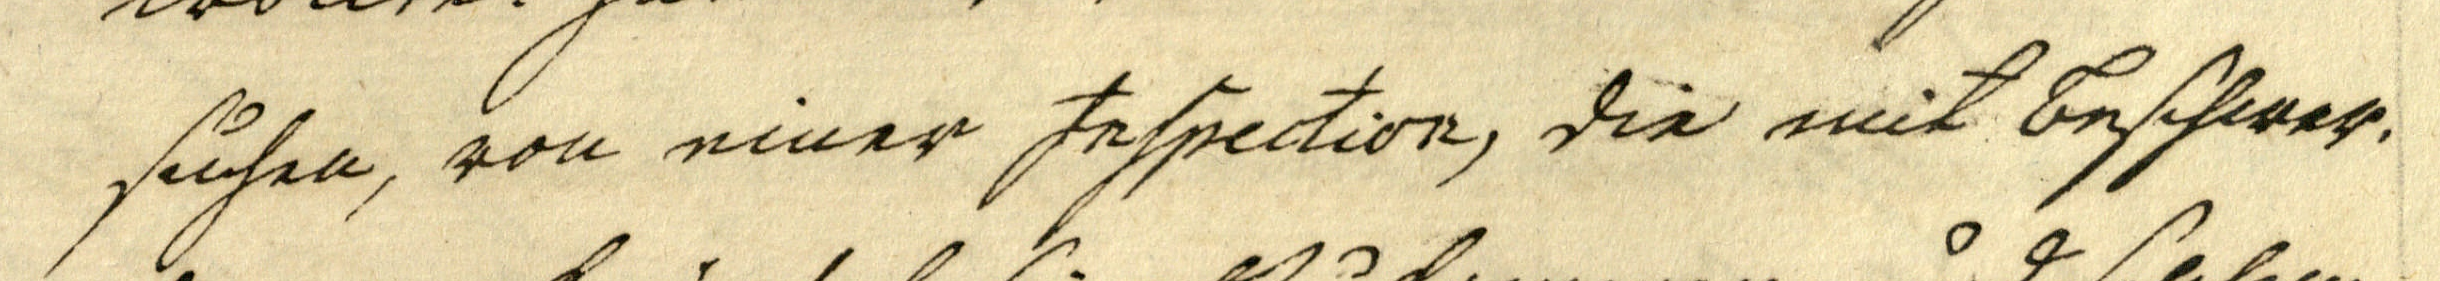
suchen, von einer Inspection, die mit Beschwer-
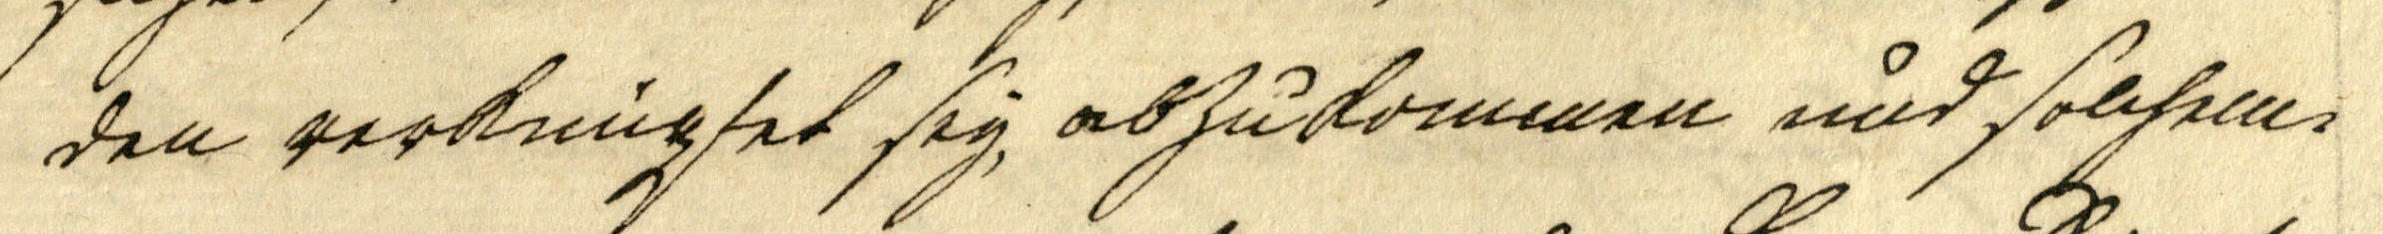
den verknüpfet sey, abzukommen und solchem-
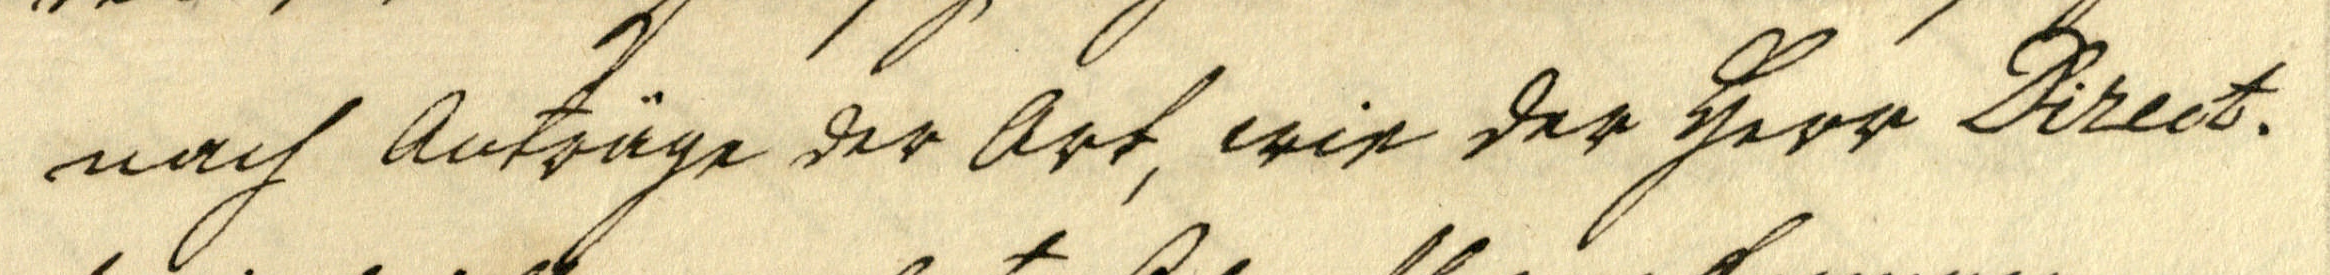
nach Anträge der Art, wie der Herr Direct.
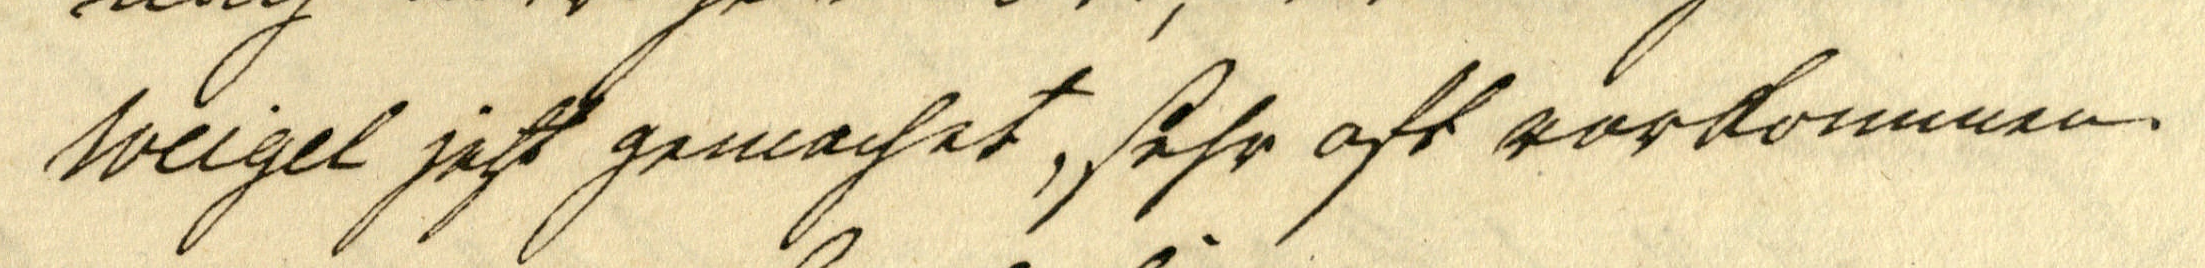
Weigel jetzt gemachet, sehr oft vorkommen.
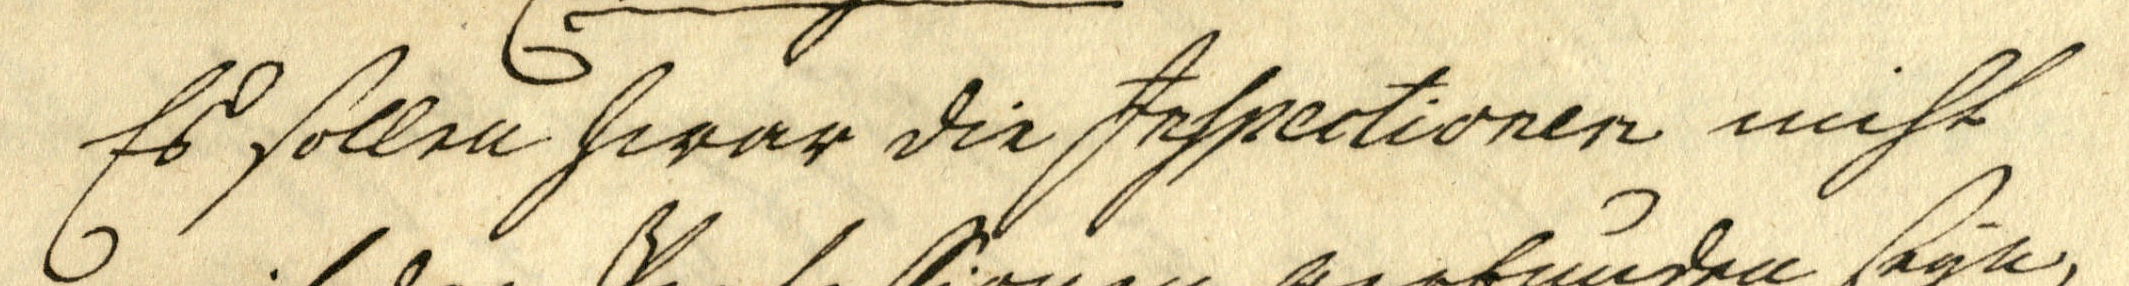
Es sollen zwar die Inspectionen nicht
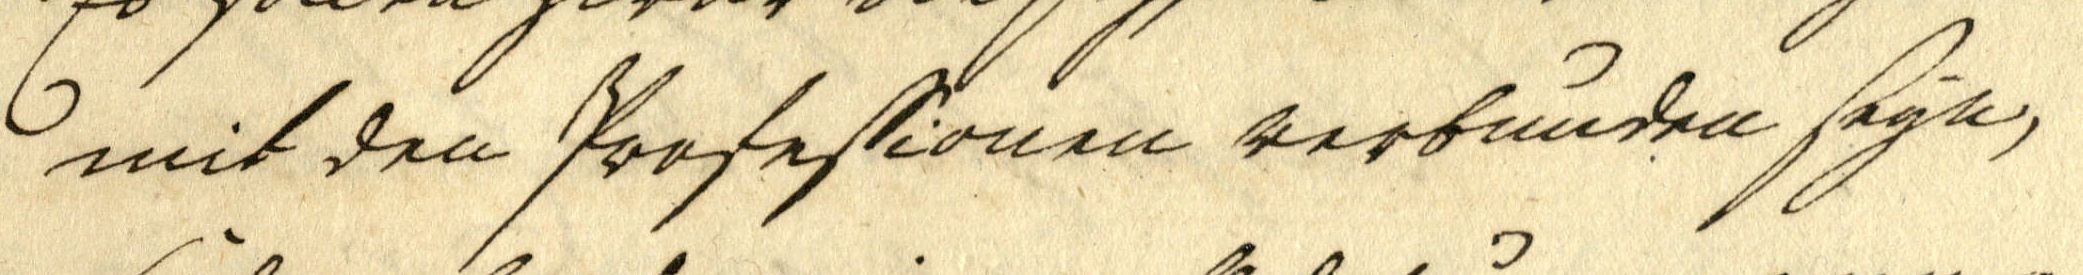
mit den Professionen verbunden seyn,
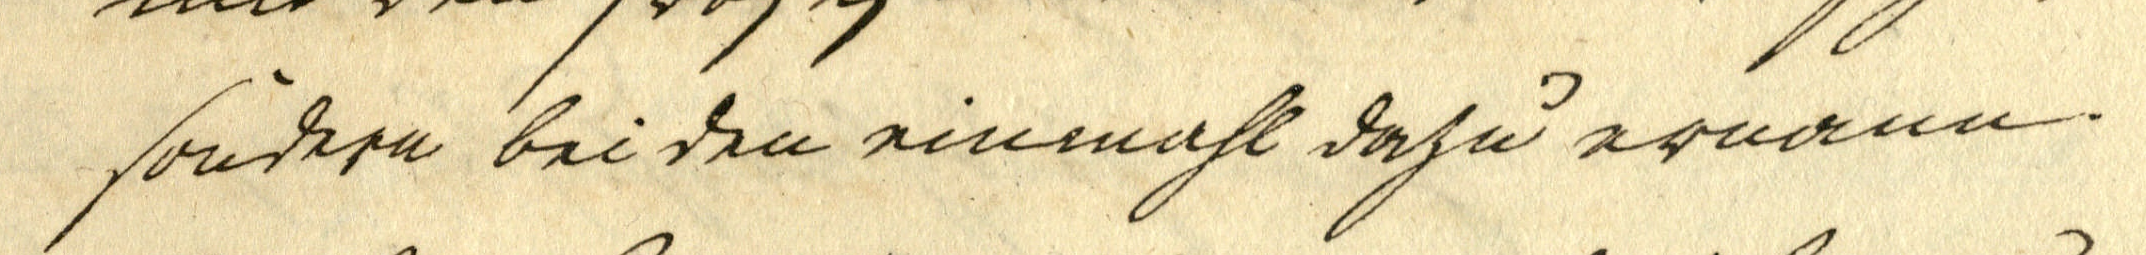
sondern bei den einmahl dazu ernann-
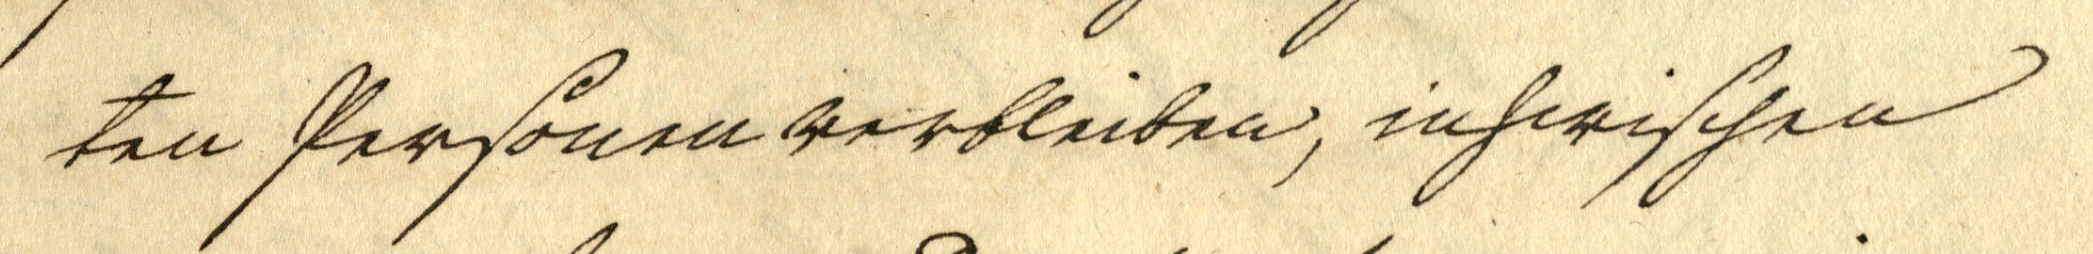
ten Personen verbleiben, inzwischen
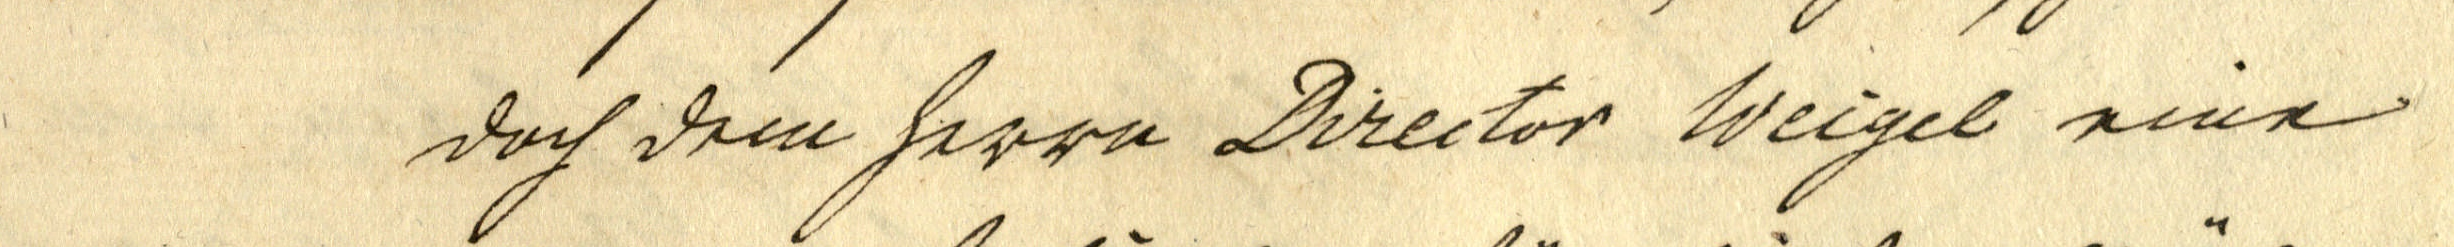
doch dem herrn Director Weigel eine
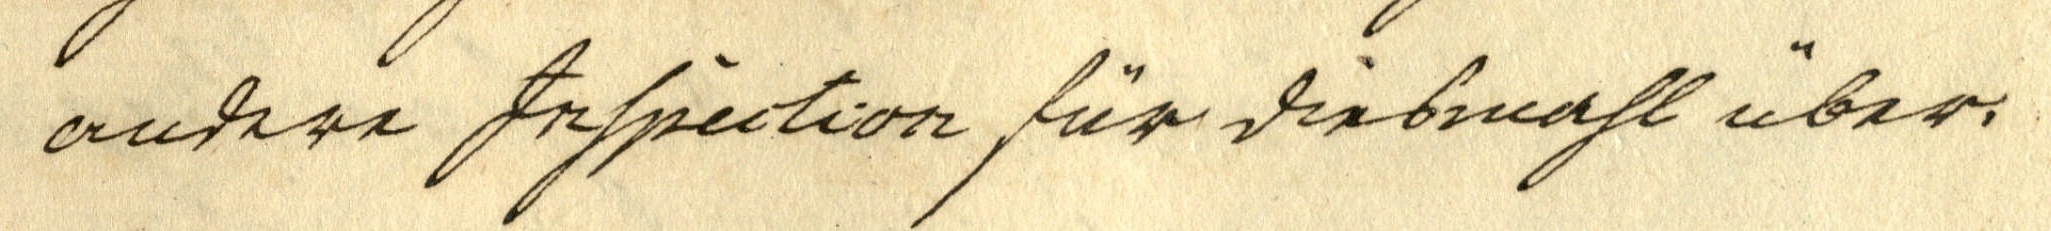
andere Inspection für diesmahl über-
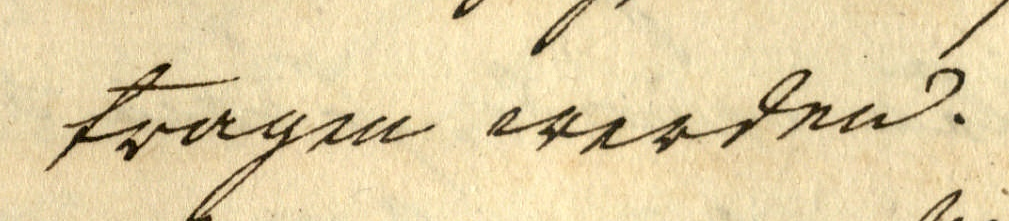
tragen werden.
